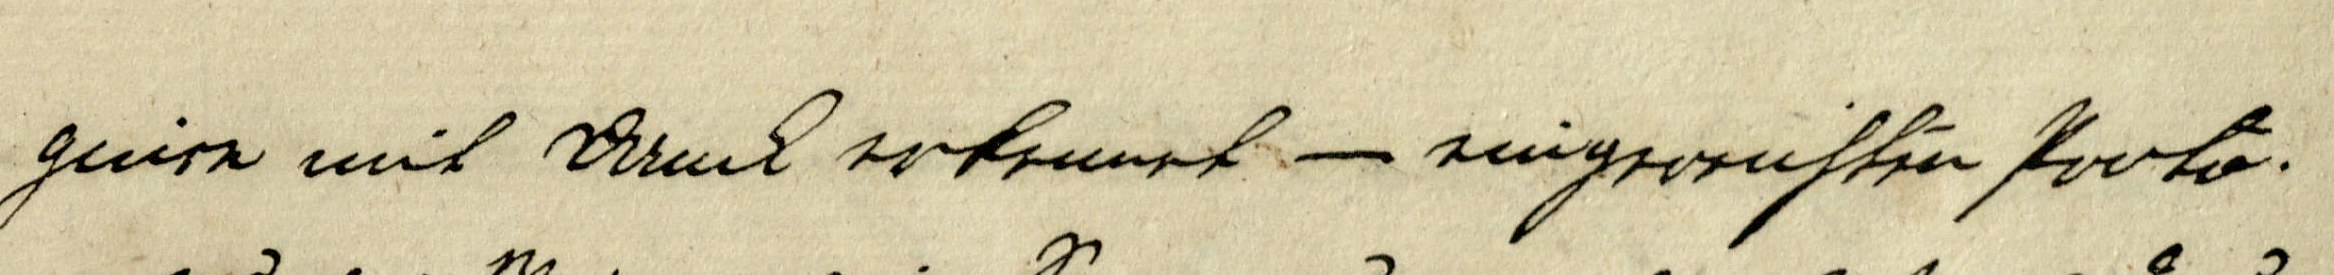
gium mit Danck erkennet eingereichten Proto¬
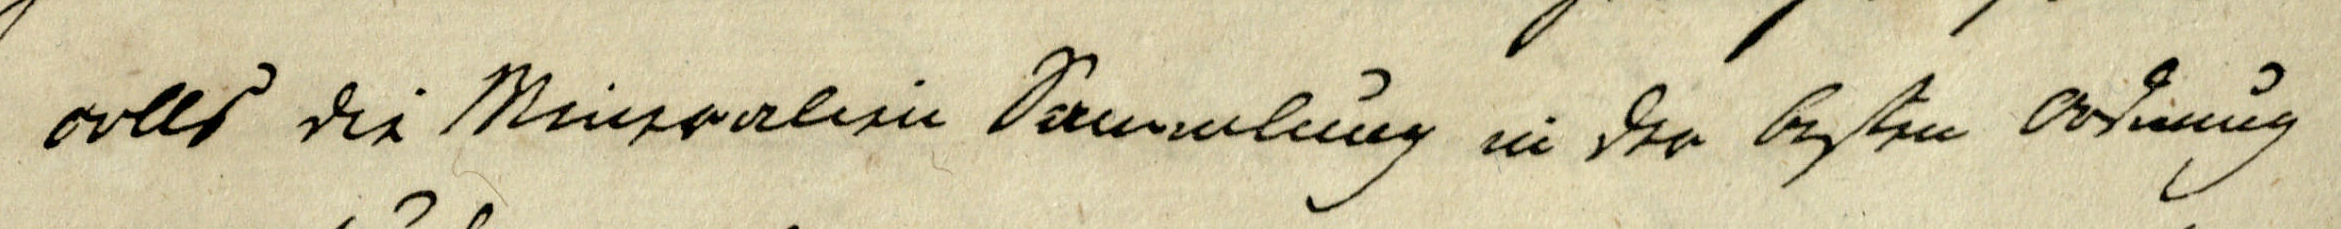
colls die Mineralien Sammlung in der besten Ordnung
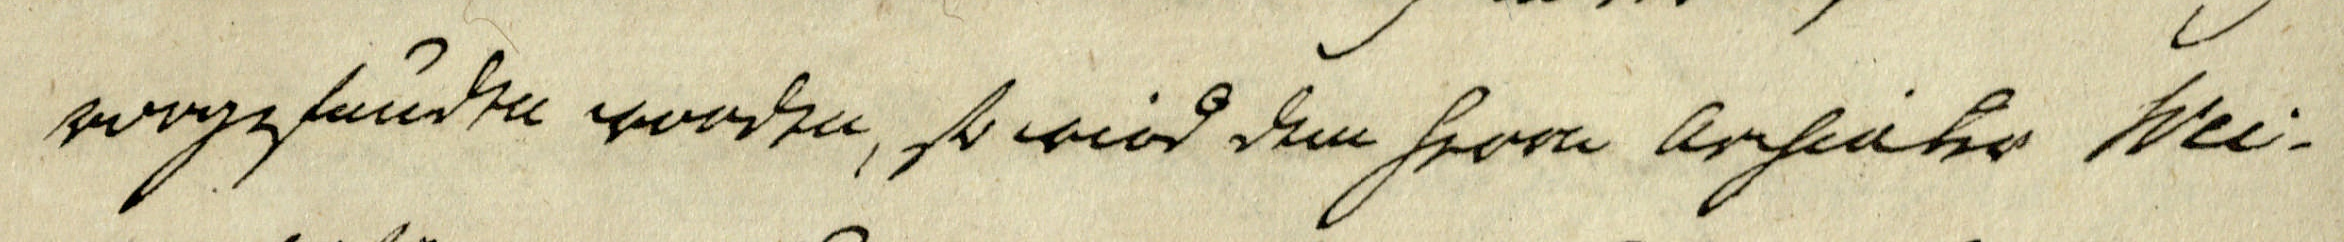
vorgefunden worden, so wird dem Herrn Archiater Wei¬
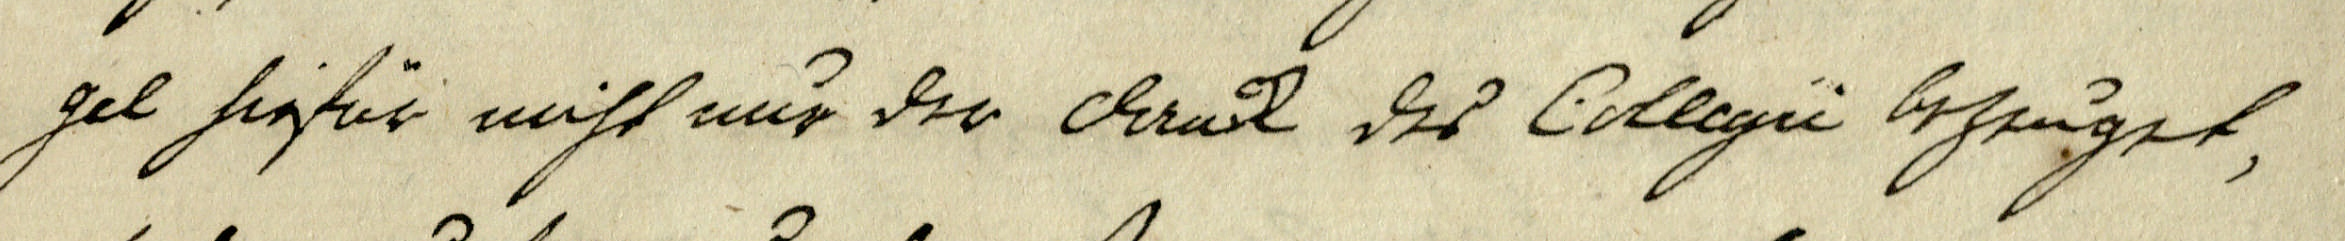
gel hiefür nicht nur der Danck des Collegii bezeuget,
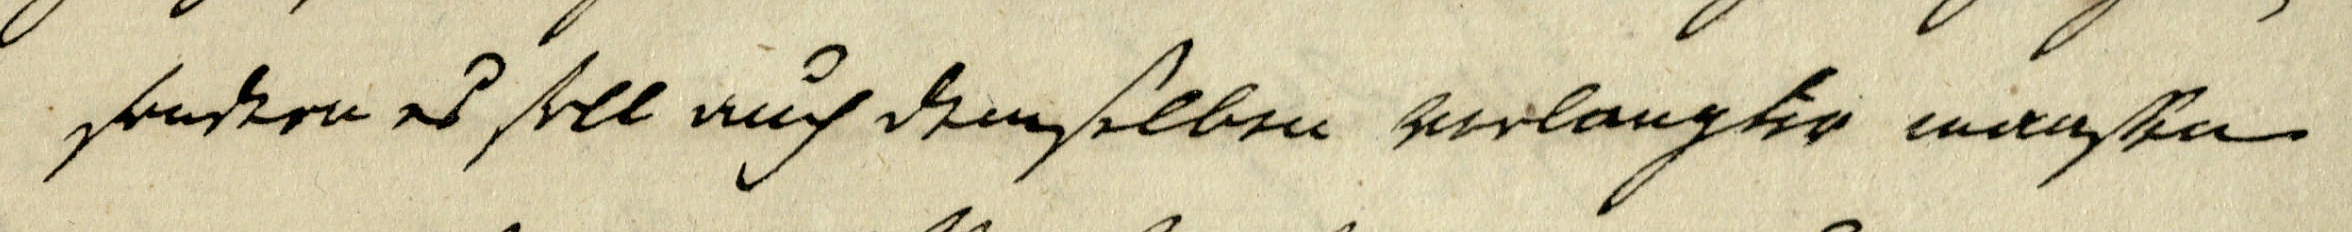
sondern es soll auch demselben verlangter maassen
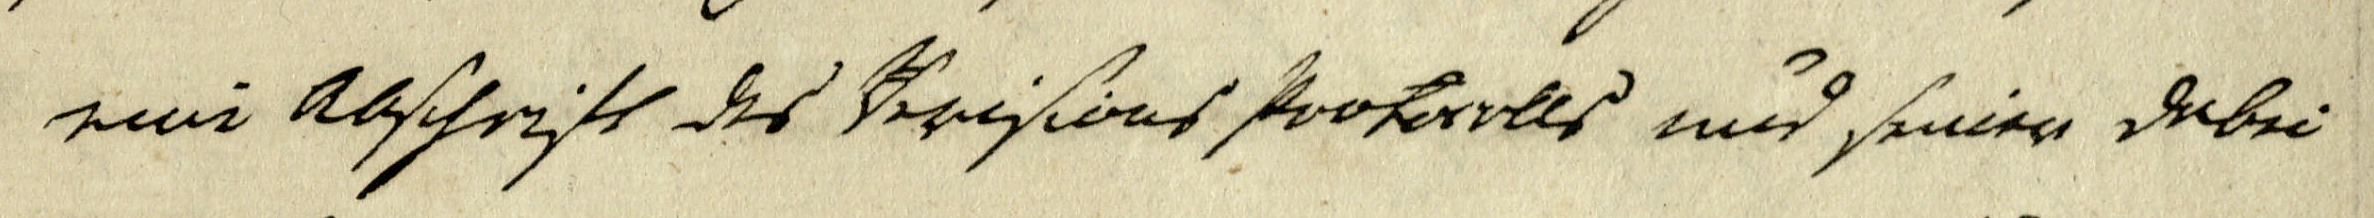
eine Abschrift des Revisions Protocolls und seiner dabei
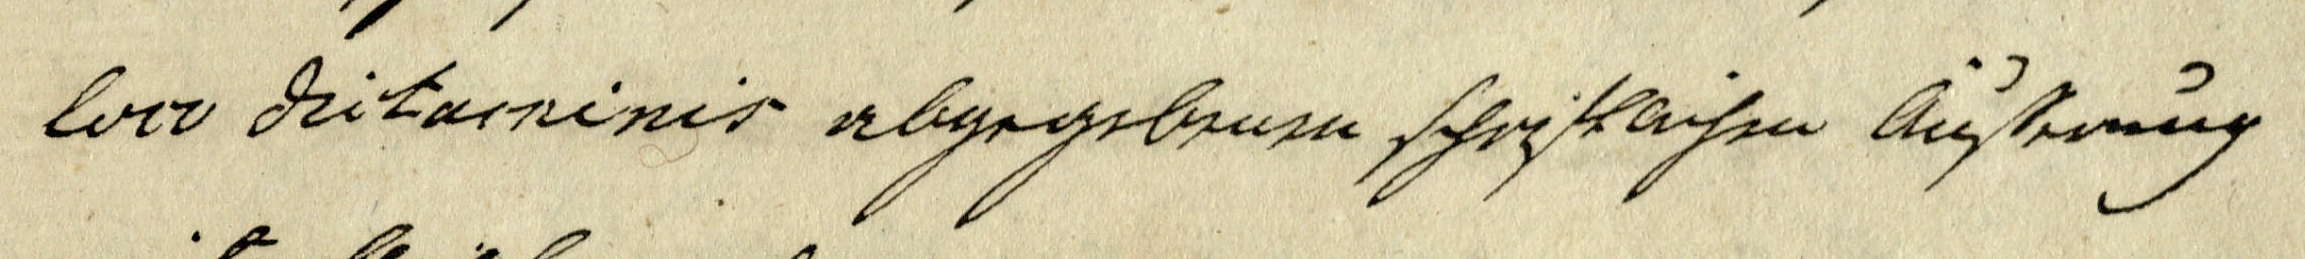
loco dictaminis abgegebenen schriftlichen Äusserung
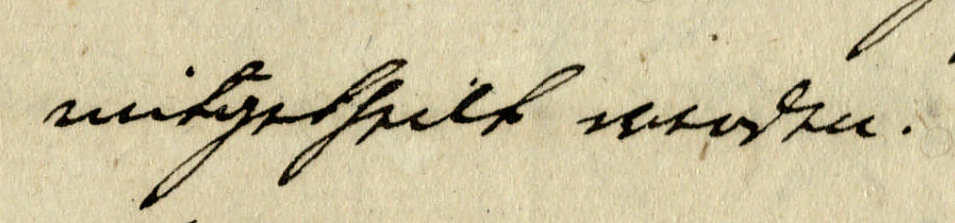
mitgetheilt werden.
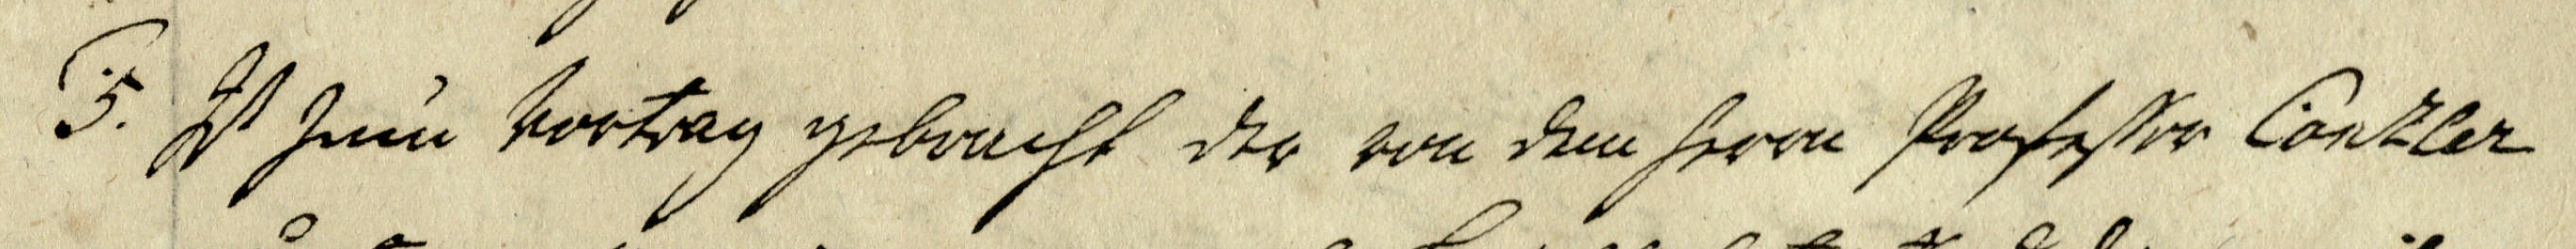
5. Ist zum Vortrag gebracht der von dem Herrn Professor Canzler
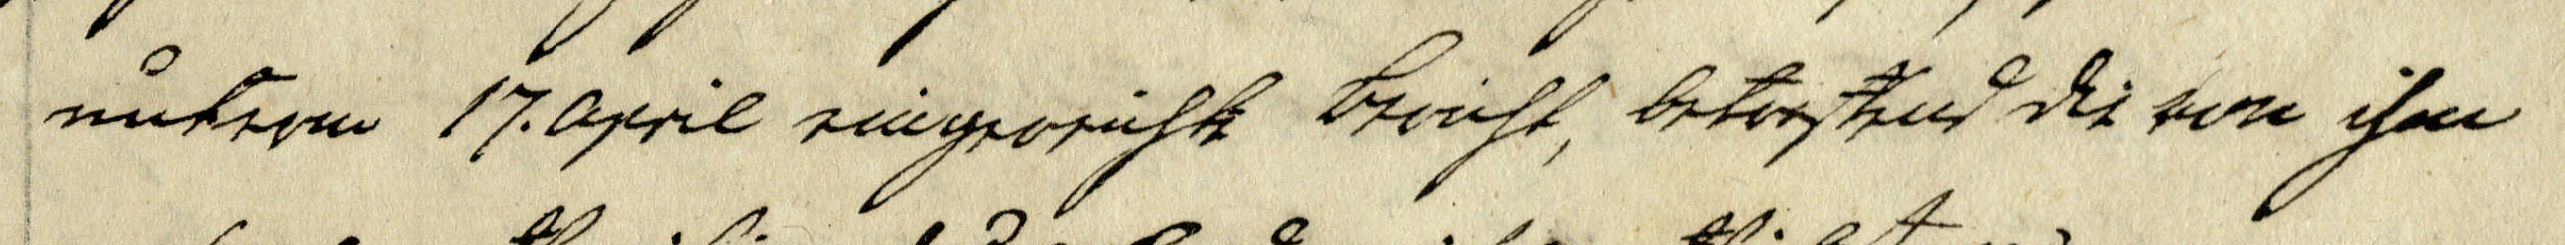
unterm 17. April eingereichte Bericht, betreffend die von ihm
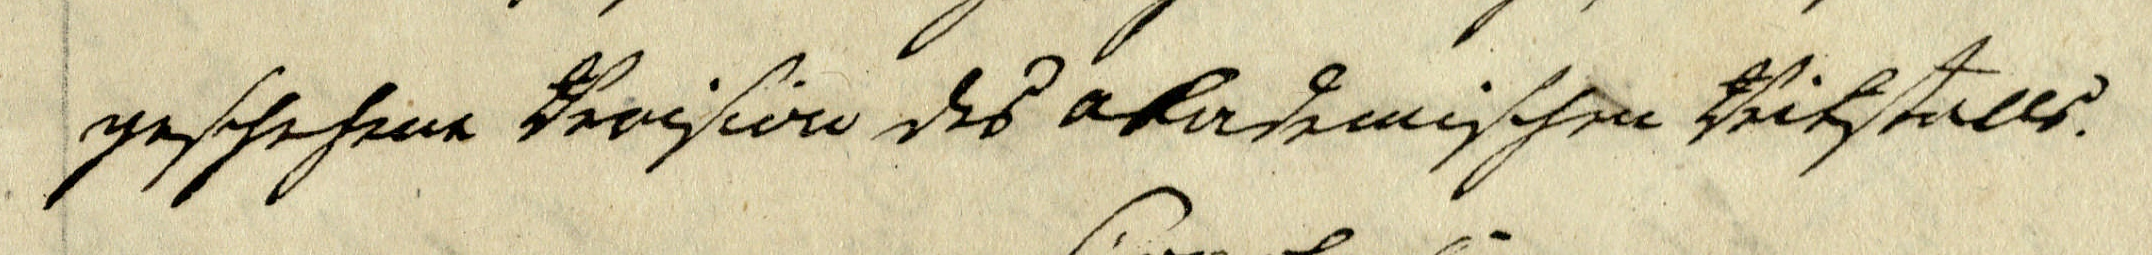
geschehene Revision des akademischen Reitstalls.
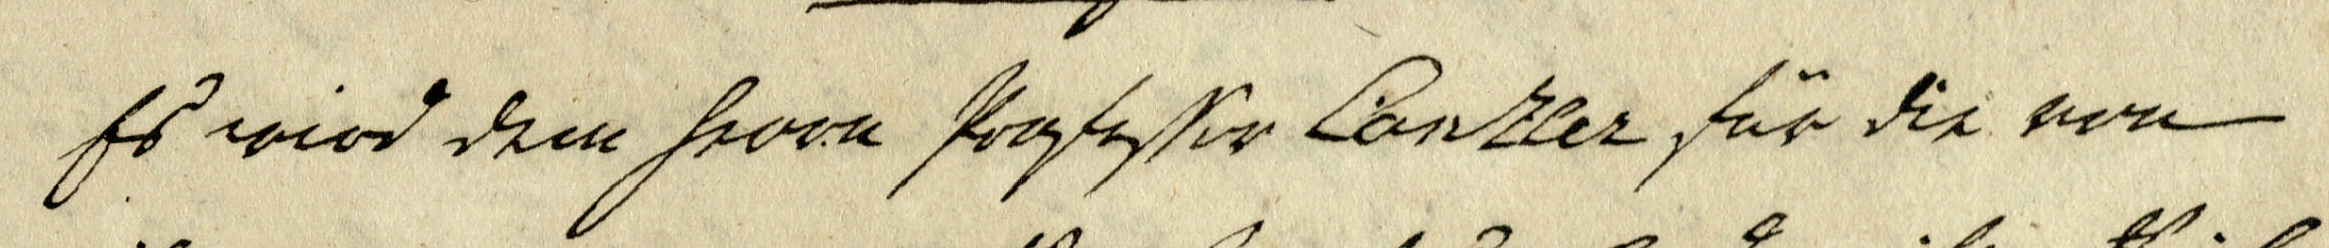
Es wird dem Herrn Professor Canzler für die von
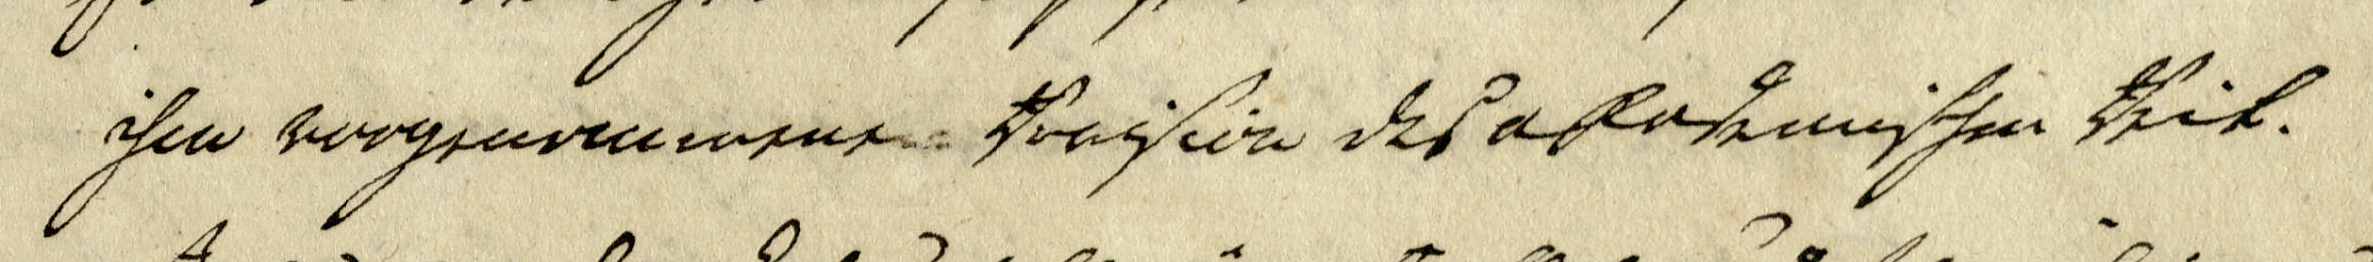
ihm vorgenommene Revision des akademischen Reit¬
